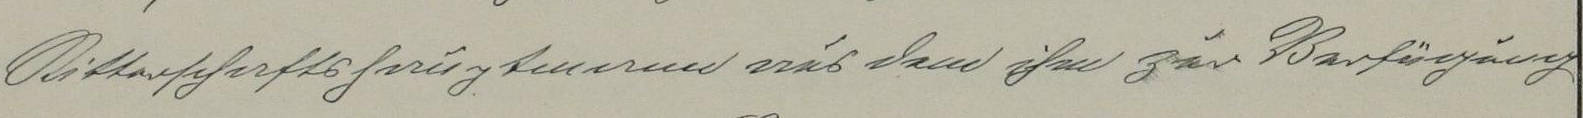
Ritterschaftshauptmann, aus dem ihm zur Verfügung
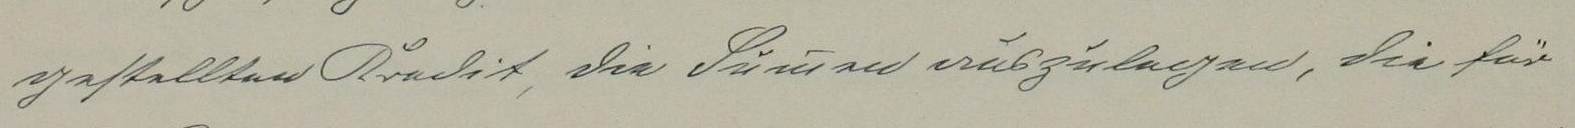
gestellten Kredit, die Summen auszulegen, die für
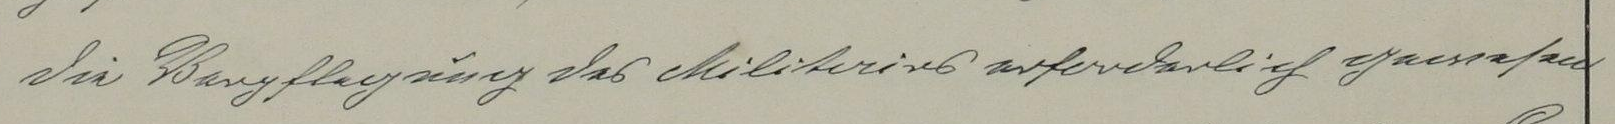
die Verpflegung des Militairs erforderlich gewesen
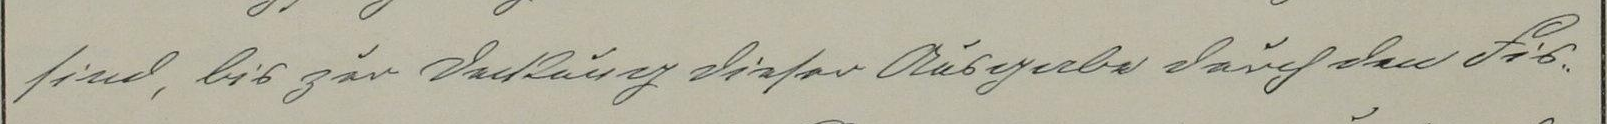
sind, bis zur Deckung dieser Ausgabe durch den Fis-
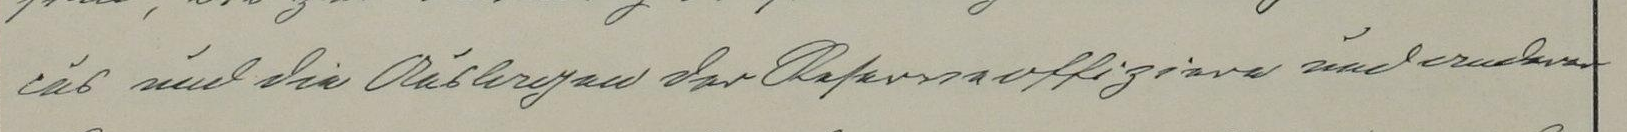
cus, und die Auslagen der Reserveoffiziere und anderer
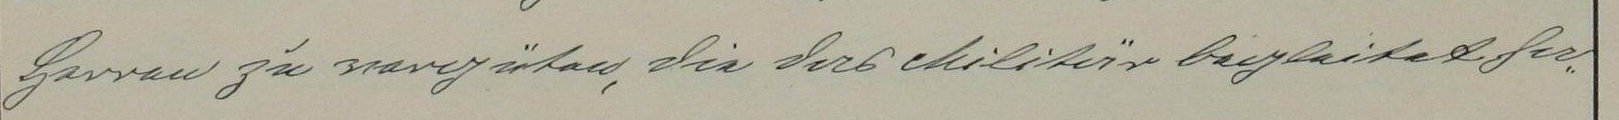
Herren zu vergüten, die das Militär begleitet ha-
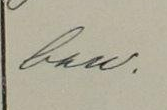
ben.
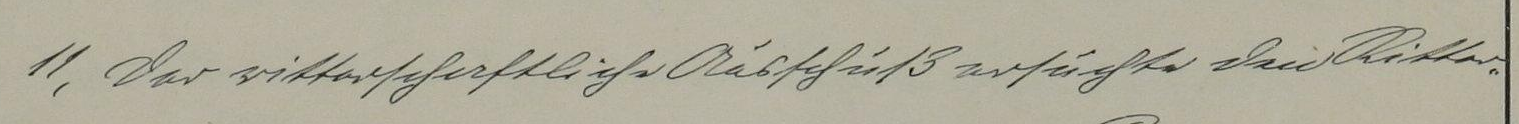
11. Der ritterschaftliche Ausschuß ersuchte den Ritter-
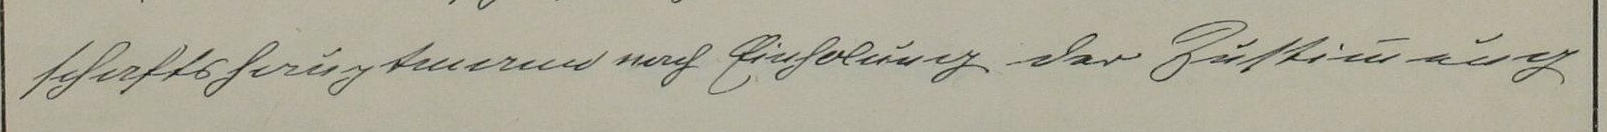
schaftshauptmann, nach Einholung der Zustimmung
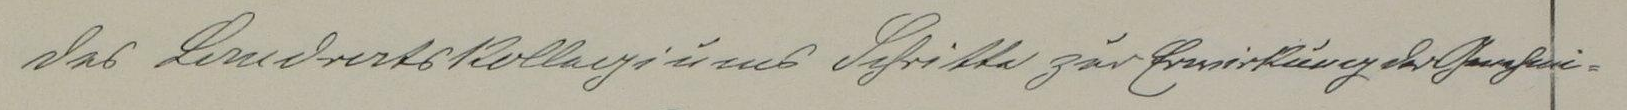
des Landratskollegiums Schritte zur Erwirkung der Genehmi-
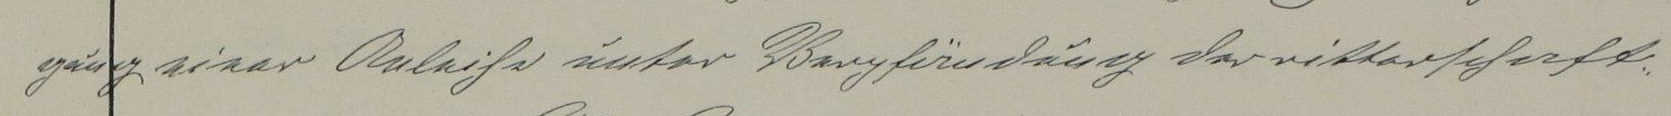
gung einer Anleihe unter Verpfändung der ritterschaft-
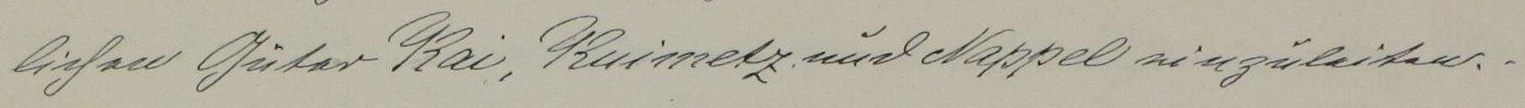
lichen Güter Kai, Kuimetz und Nappel einzuleiten.
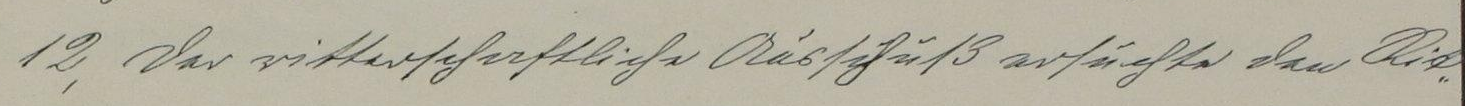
12. Der ritterschaftliche Ausschuß ersuchte den Rit-
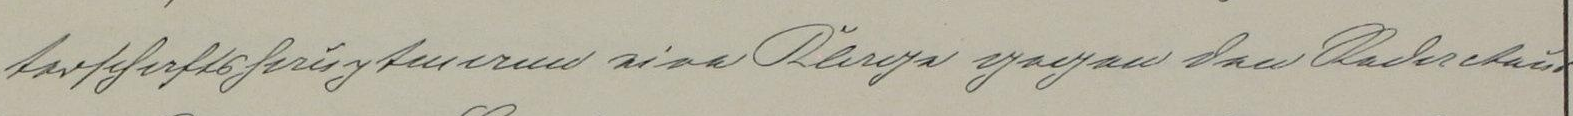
terschaftshauptmann, eine Klage gegen den Redacteur
